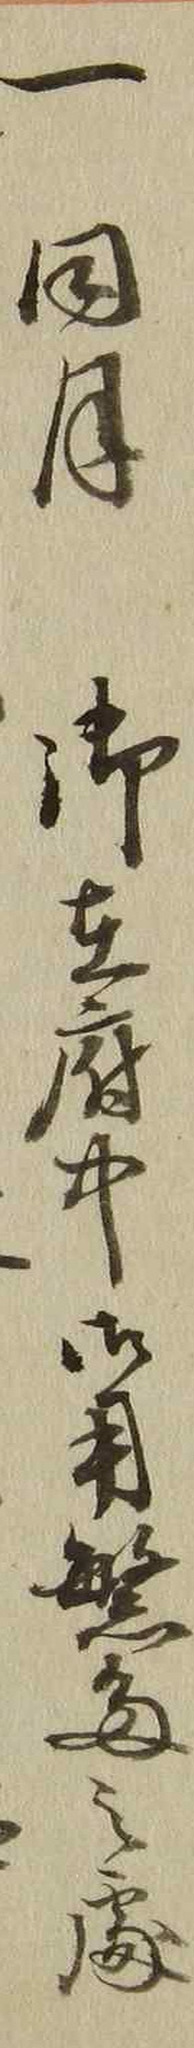一同月御在府中御用繫多之處
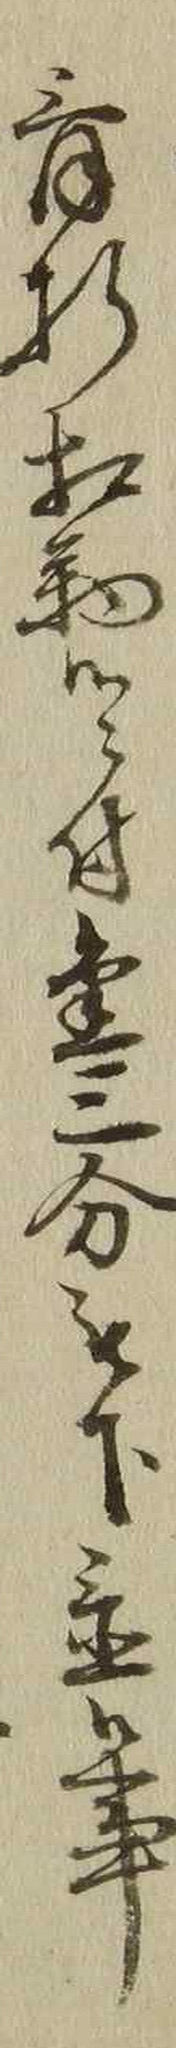骨折相勤候ニ付金三分被下置候事
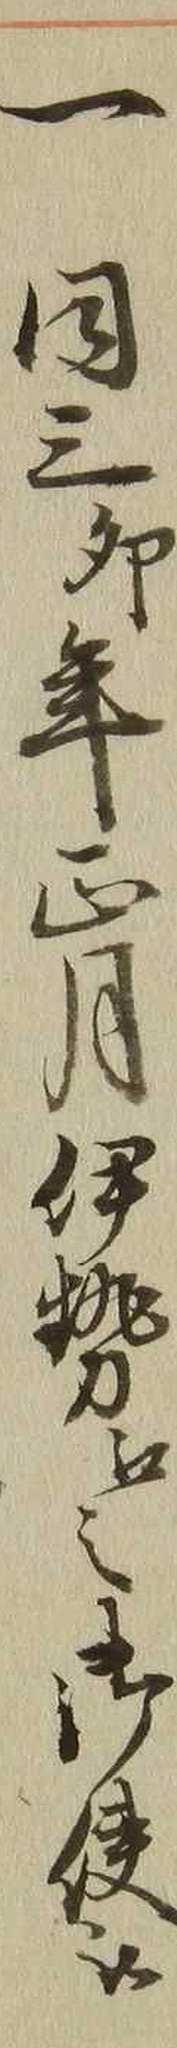一同三卯年正月伊勢江之御使被
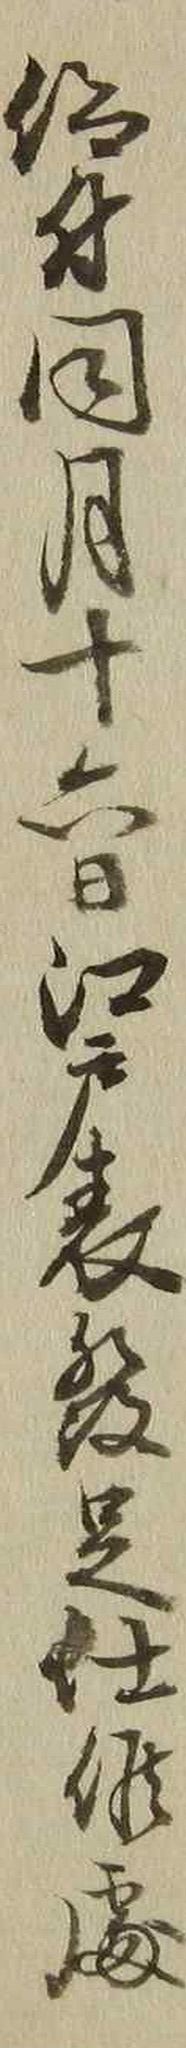仰付同月十六日江戸表発足仕候處
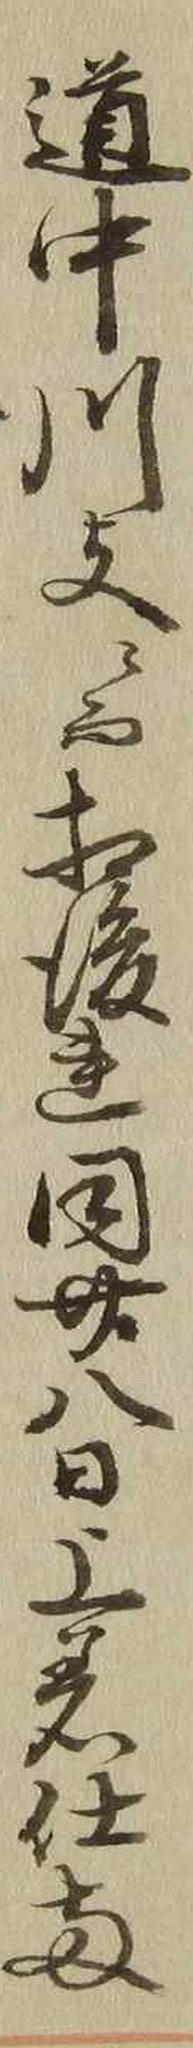道中川支ニ而相後連同廿八日上着仕両
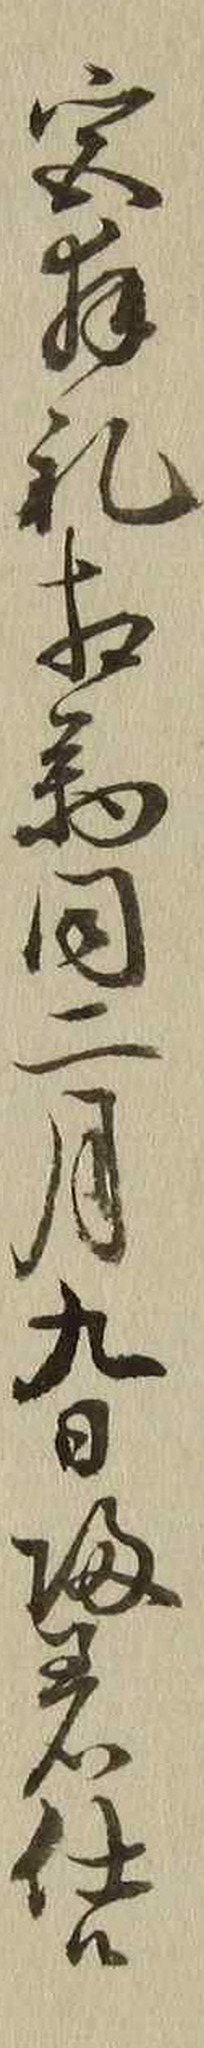宮拝礼相勤同二月九日帰着仕候
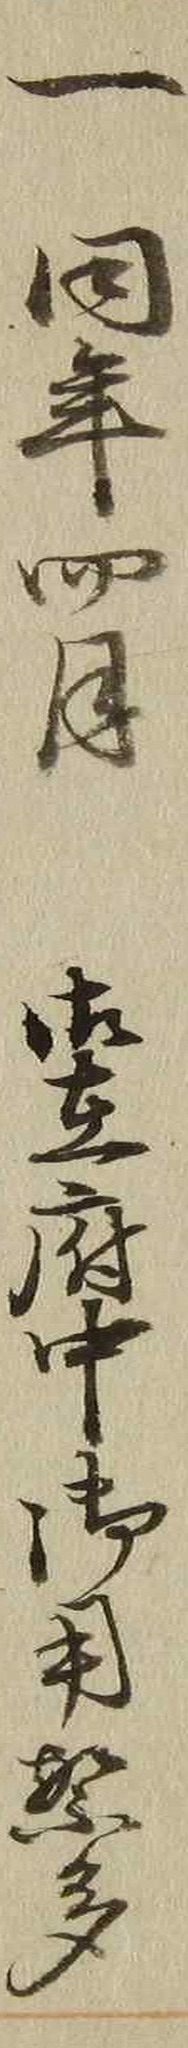一同年四月御在府中御用繫多
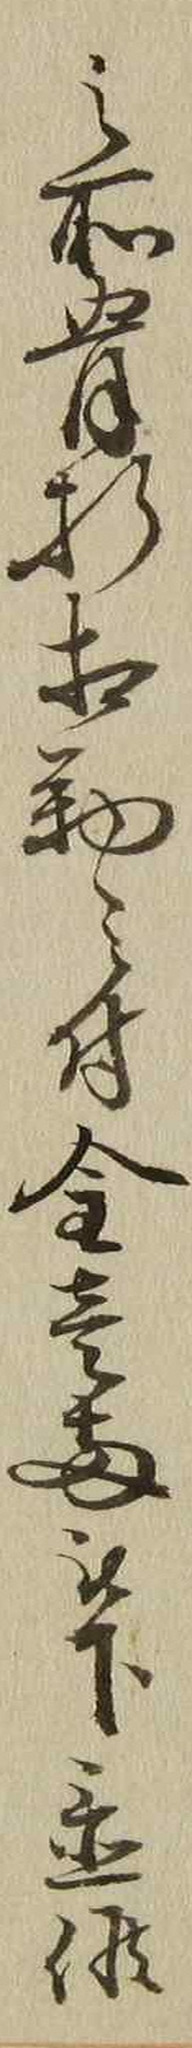之所骨折相勤候ニ付金壱両被下置候
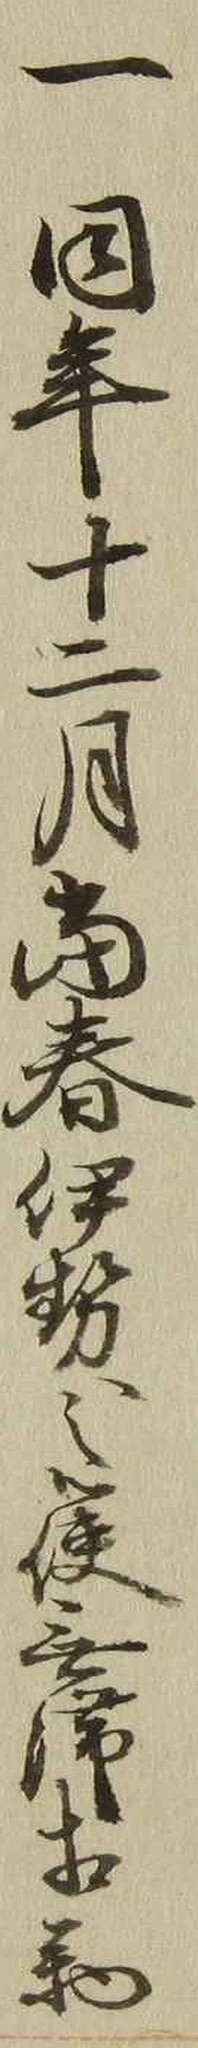一同年十二月当春伊勢之御使無滞相勤
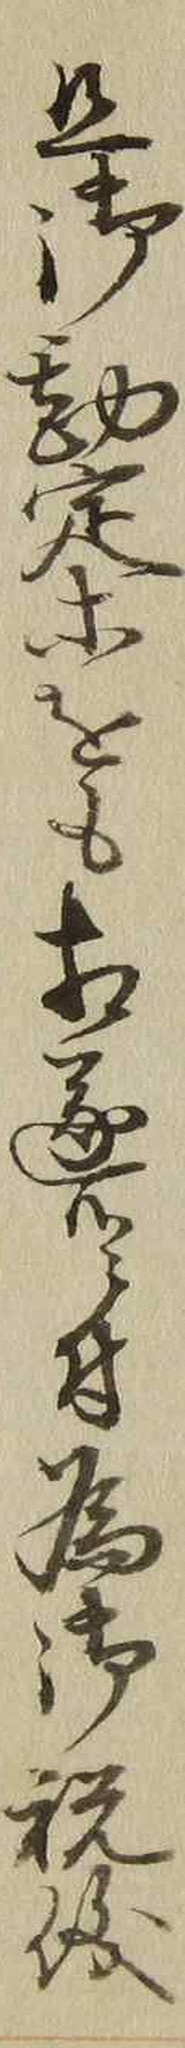且御勘定等をも相遂候ニ付為御祝儀
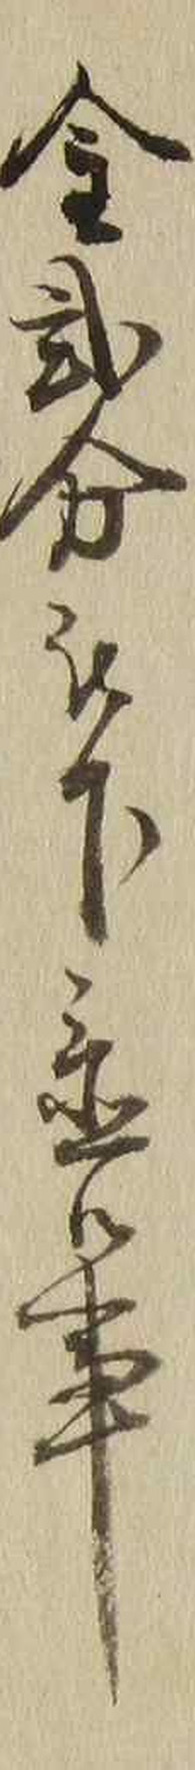金弐分被下置候事
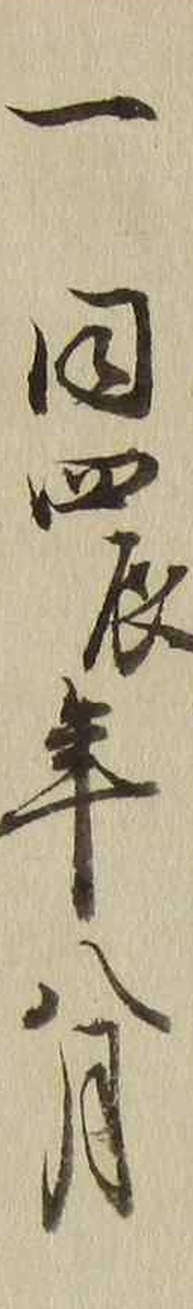一同四辰年八月
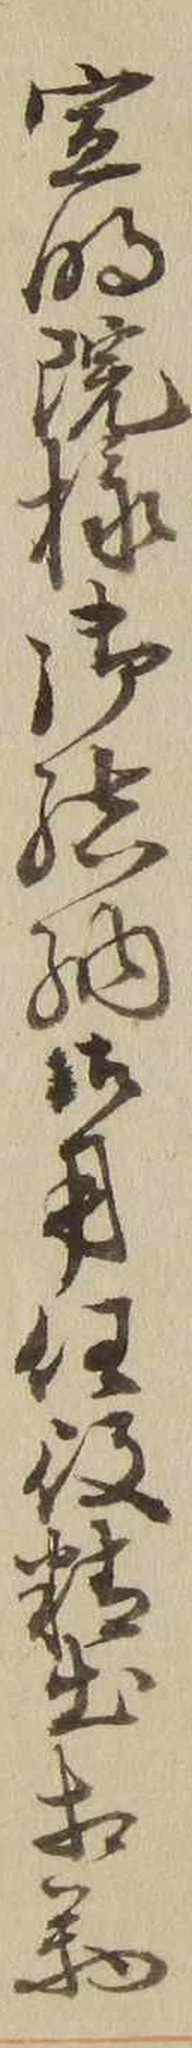宣明院様御結納御用任役精出相勤

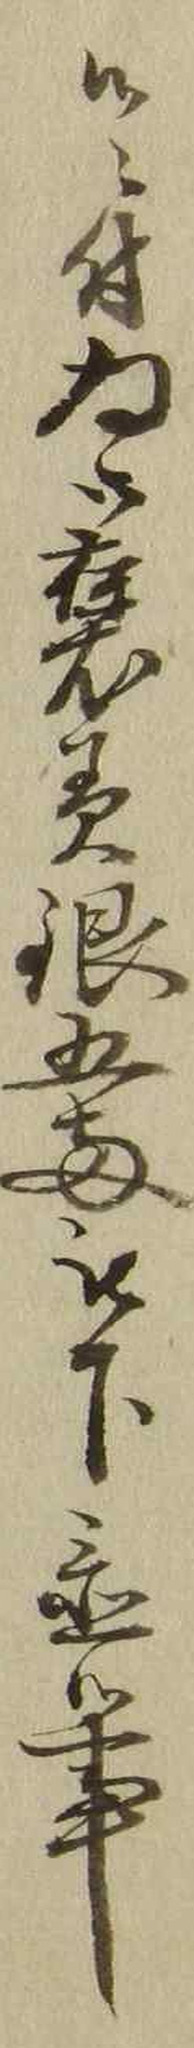候ニ付為御褒美銀五両被下置候事
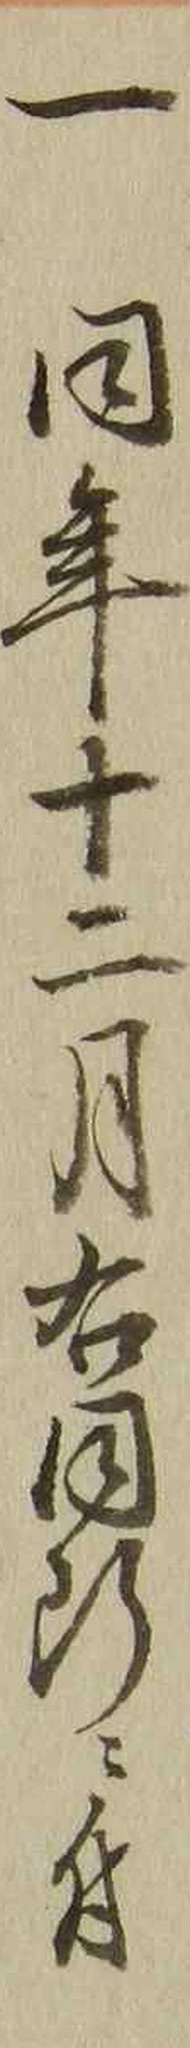一同年十二月右同断ニ付
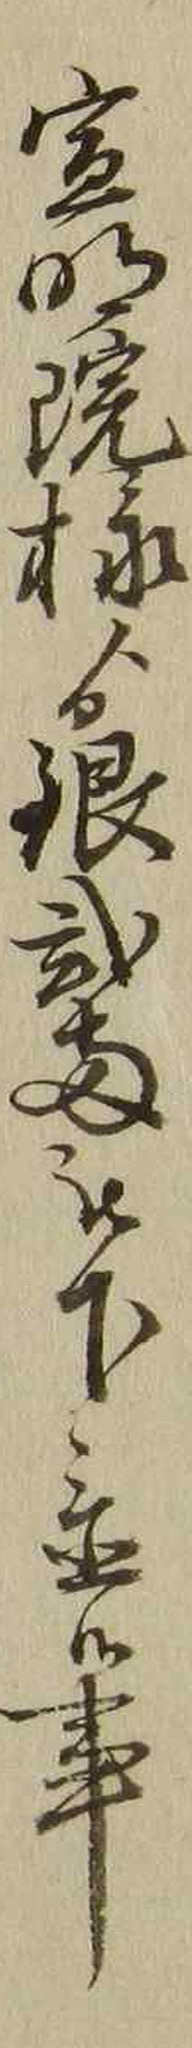宣明院様ゟ銀弐両被下置候事
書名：諸士系譜　巻之64　と之部7
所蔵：会津若松市立会津図書館
